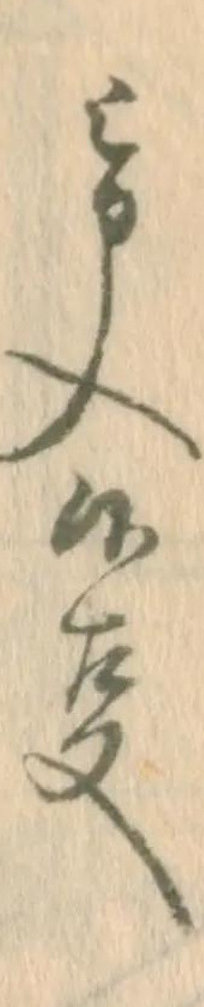被申入候事
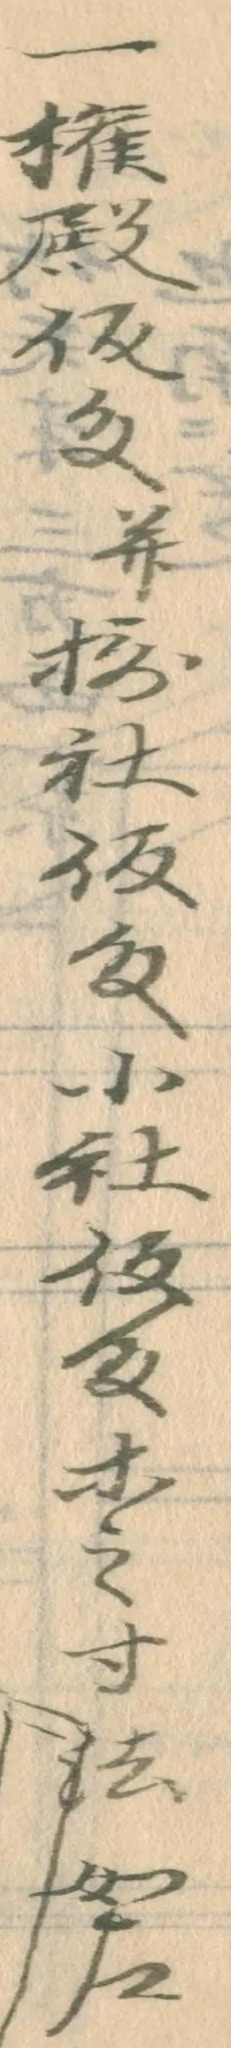一権殿仮殿并摂社仮殿小社仮殿等之寸法如左
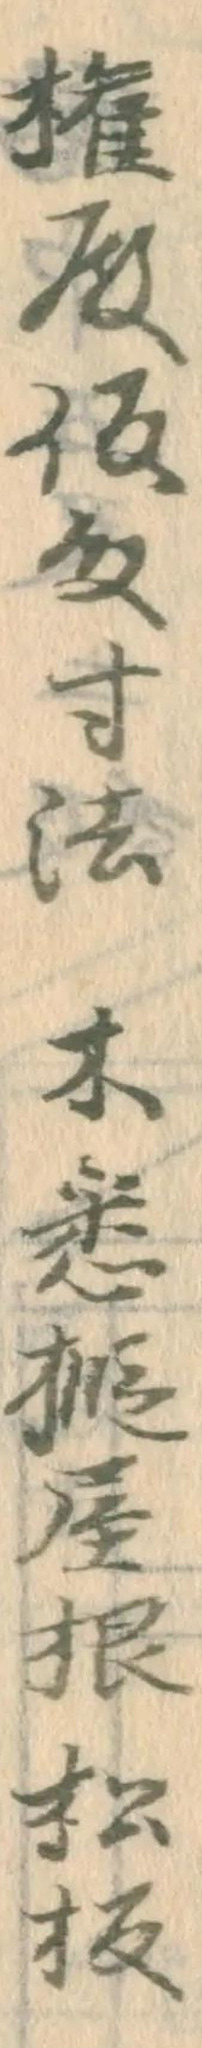権殿仮殿寸法木悉樅屋根松板
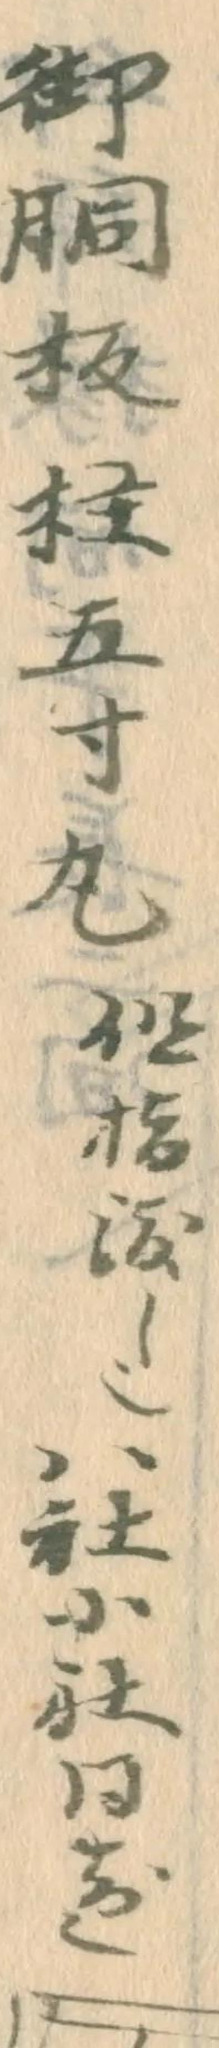御胴板柱五寸丸但指渡し也八社小社同前也

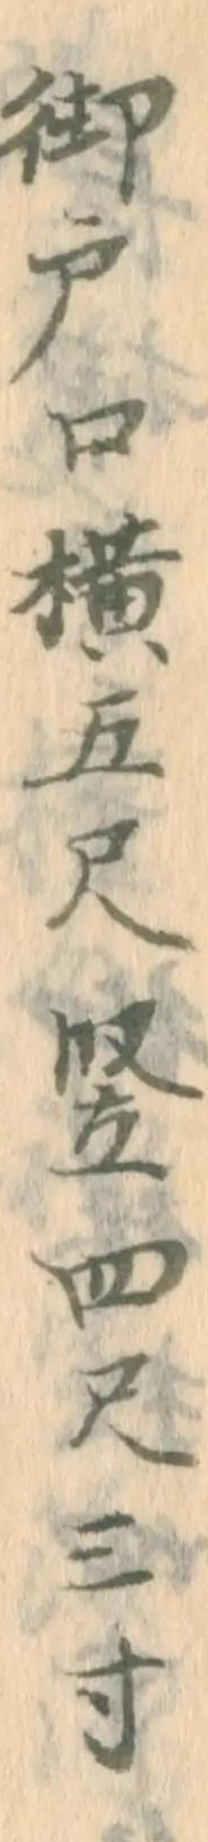御戸口横五尺竪四尺三寸
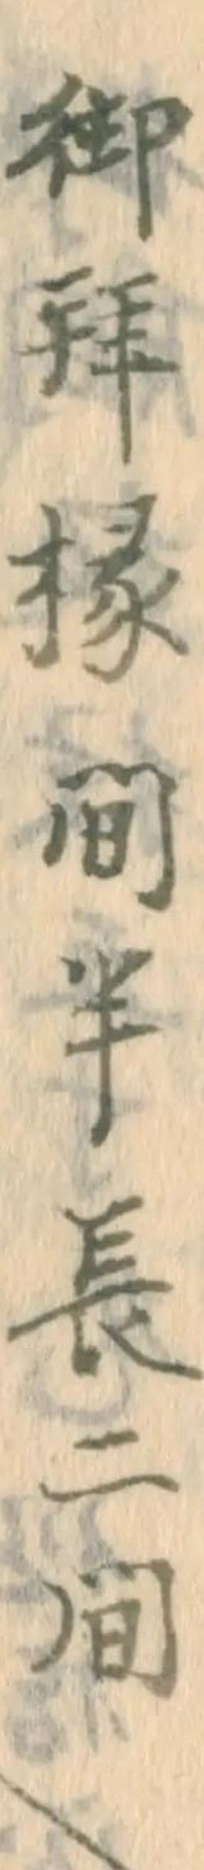御拝椽間半長二間
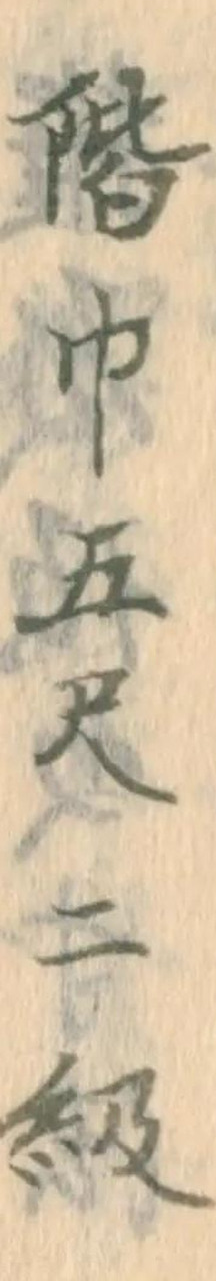階巾五尺二級
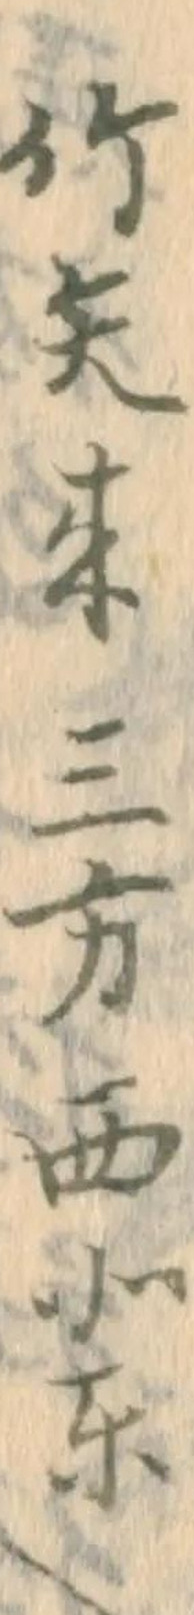竹矢来三方西北東
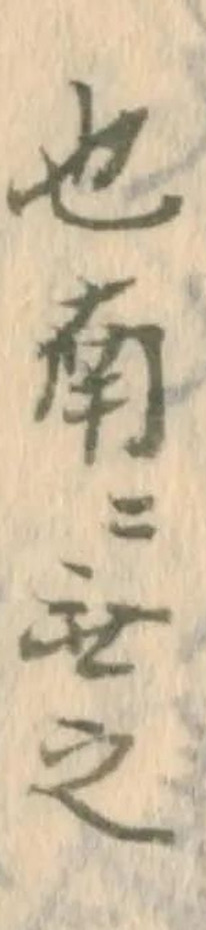也南ニ無之
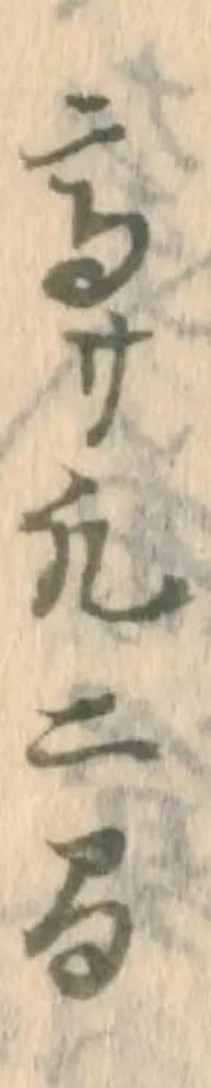高サ凡二間
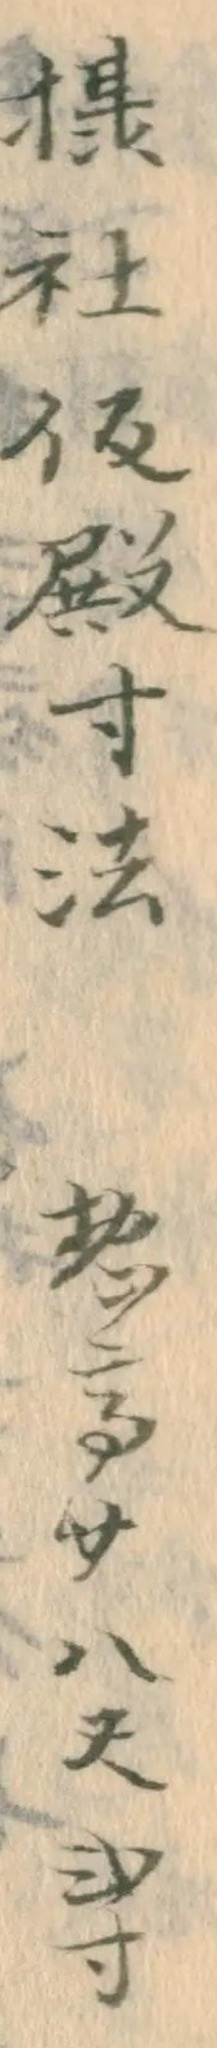摂社仮殿寸法惣高サ八尺弐寸
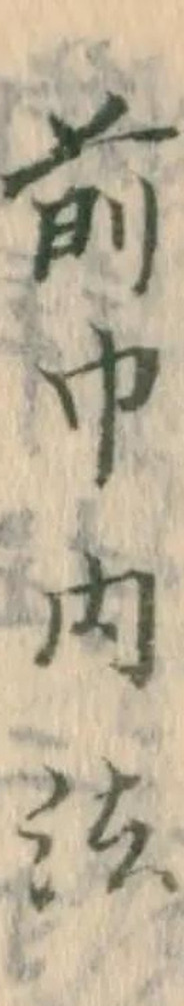前巾内法
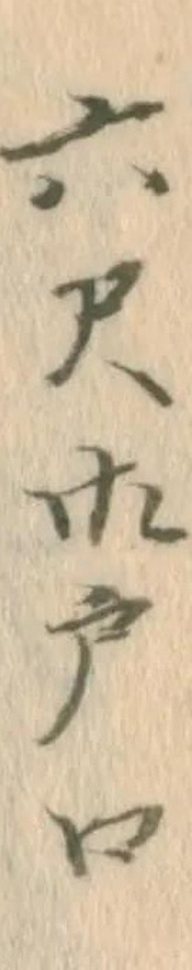六尺御戸口
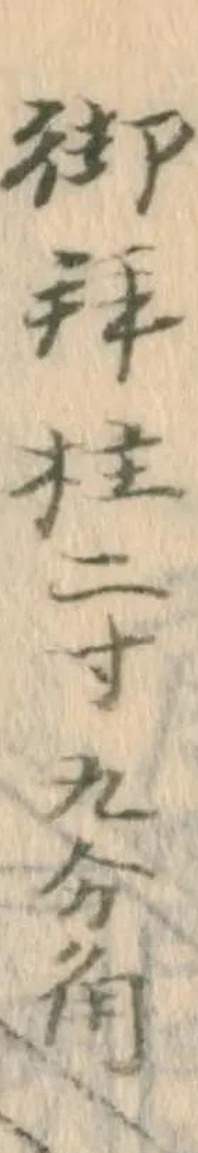御拝柱二寸九分角
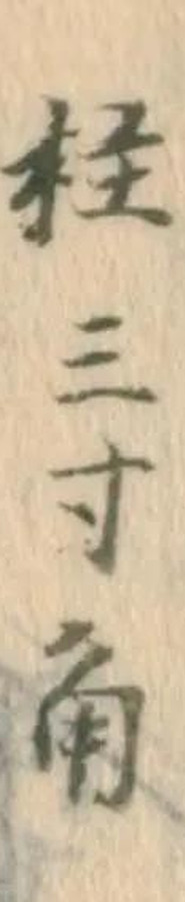柱三寸角

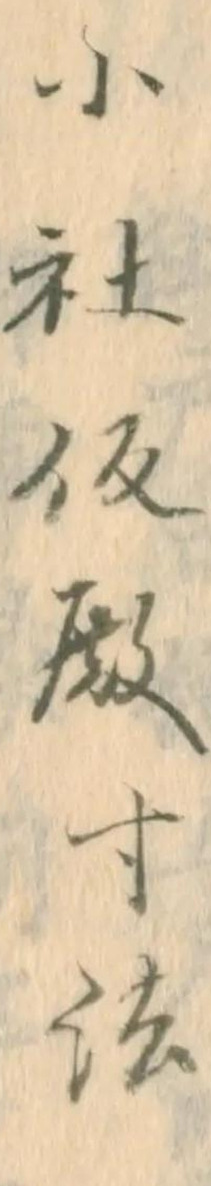小社仮殿寸法
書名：賀茂社記録. 第17冊
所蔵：国立国会図書館 National Diet Library, JAPAN
